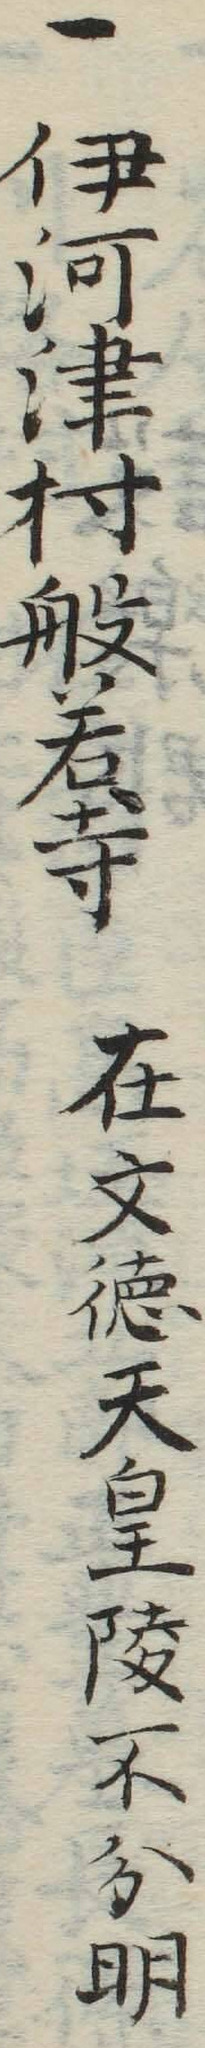一伊河津村般若寺在文徳天皇陵不分明

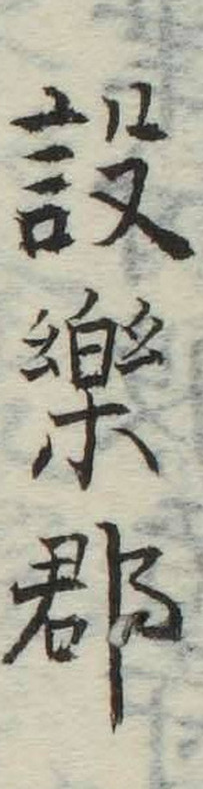設楽郡
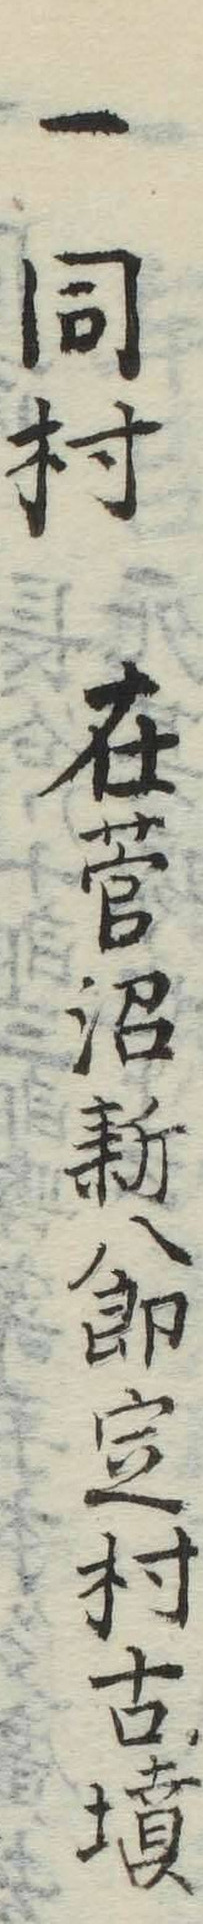一同村在菅沼新八郎定村古墳
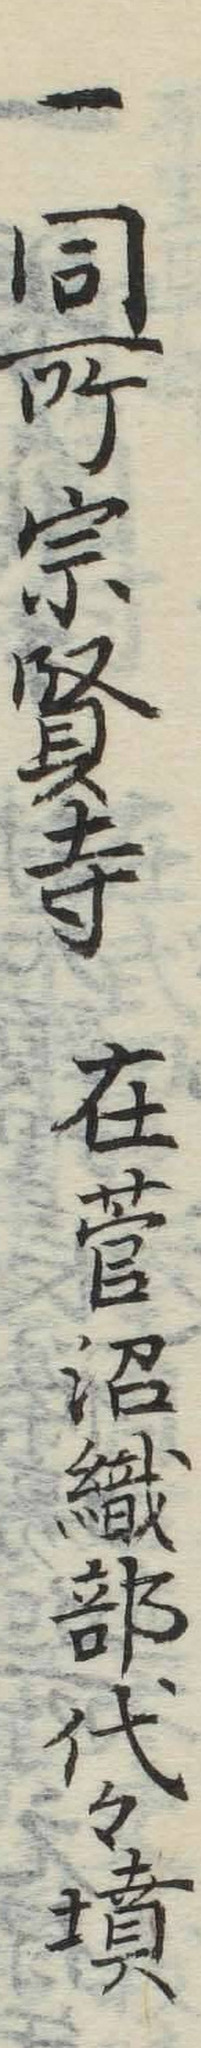一同所宗賢寺在菅沼織部代々墳
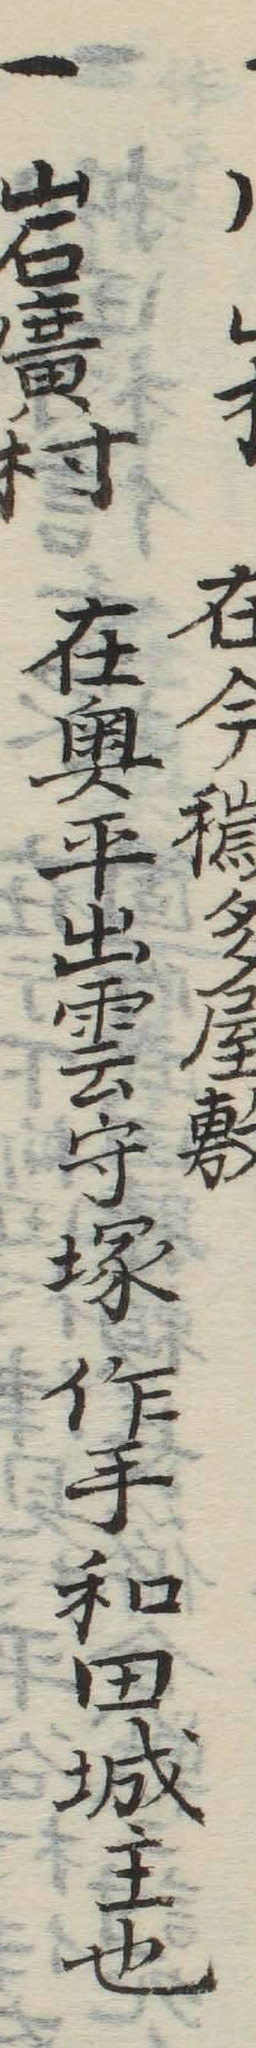一岩広村在奥平出雲守塚作手和田城主也

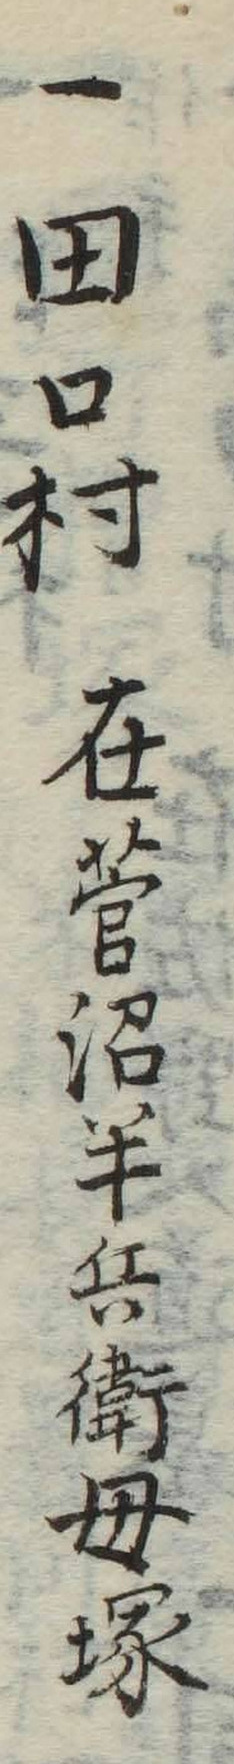一田口村在菅沼半兵衛母塚
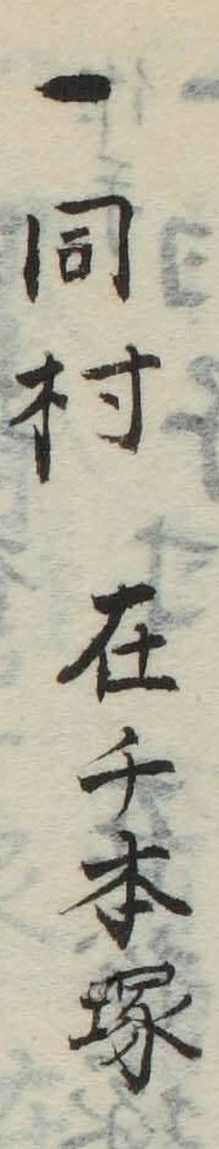一同村在千本塚
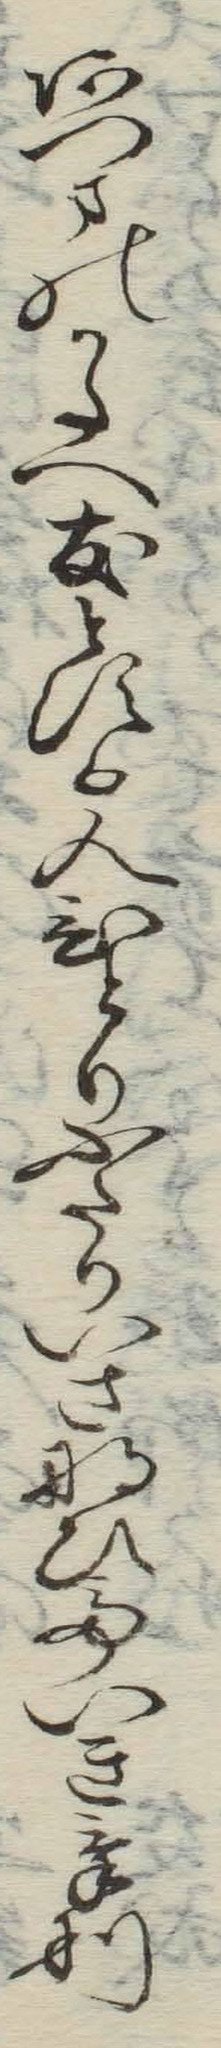あつまのかたへ友とする人ひとりふたりいさなひていきけり
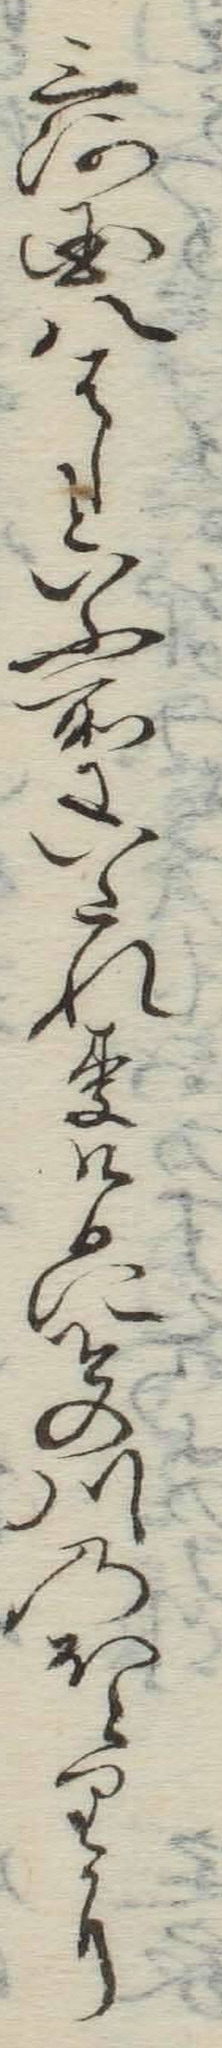三河国八はしといふ所にいたれりけるにその川のほとりに
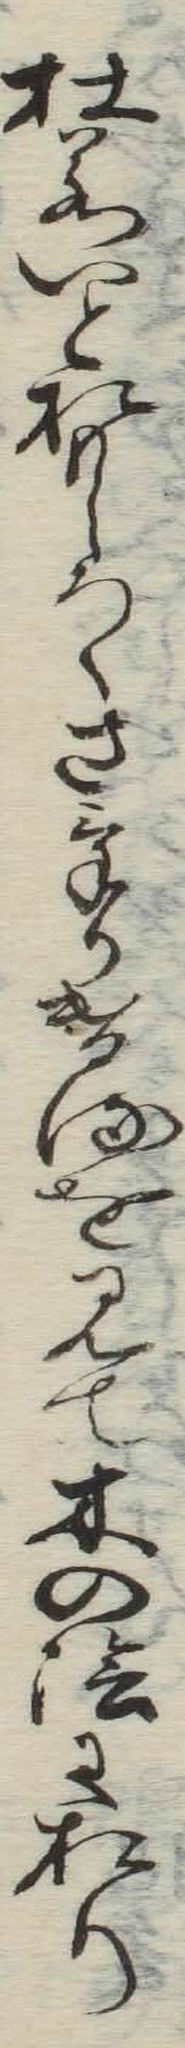杜若いとおもしろくさけりけるを見て木の陰におり
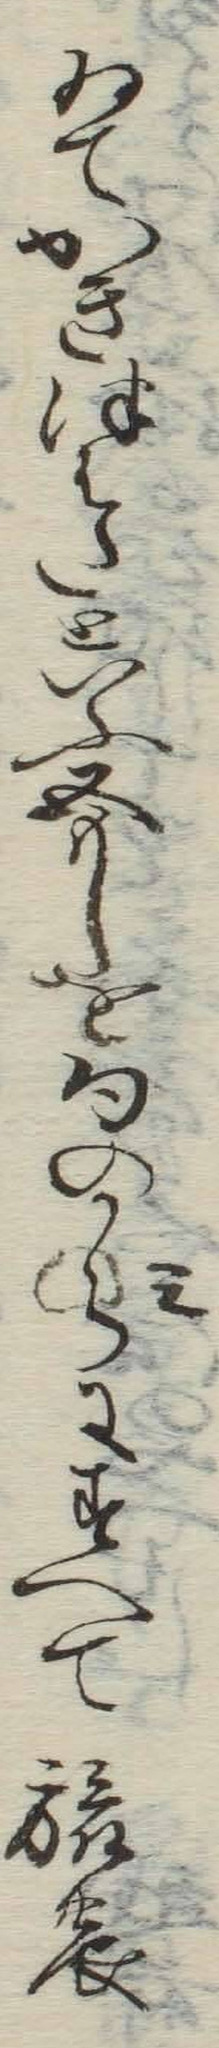ゐてかきつはたといふ五もしを句のかしらにすへて旅の
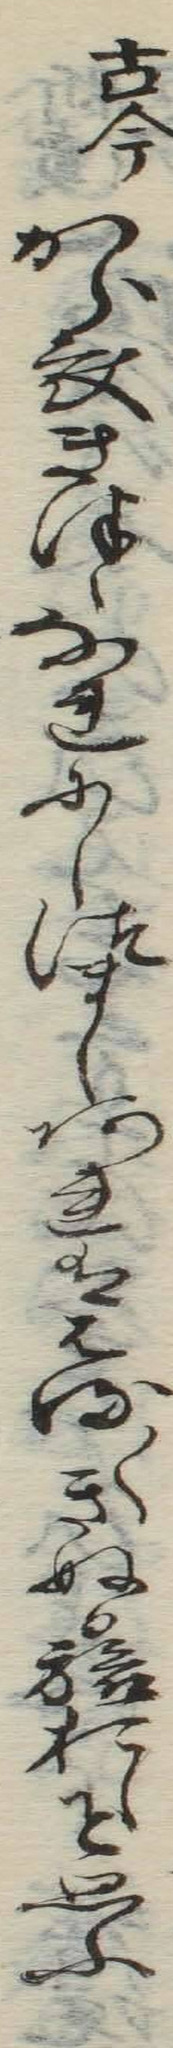古今から衣きつゝなれにしつましあれははる〳〵きぬる旅おしそ思ふ
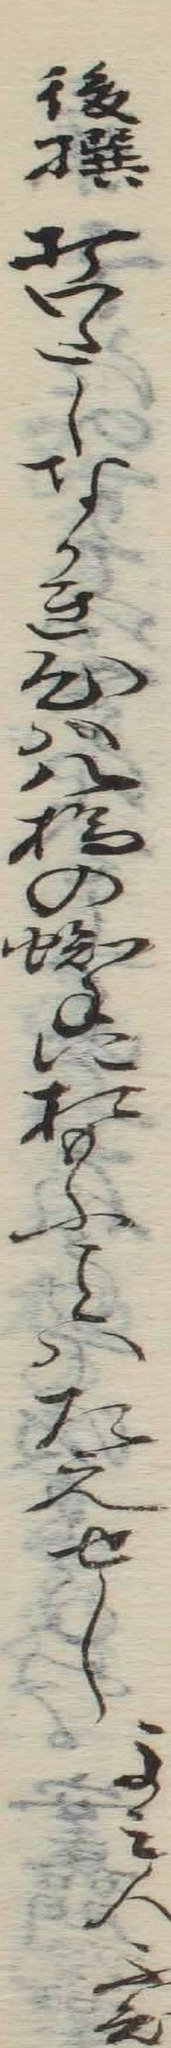後撰打わたしなかき心は八橋の蜘手におもふことはたえせしよみ人不知
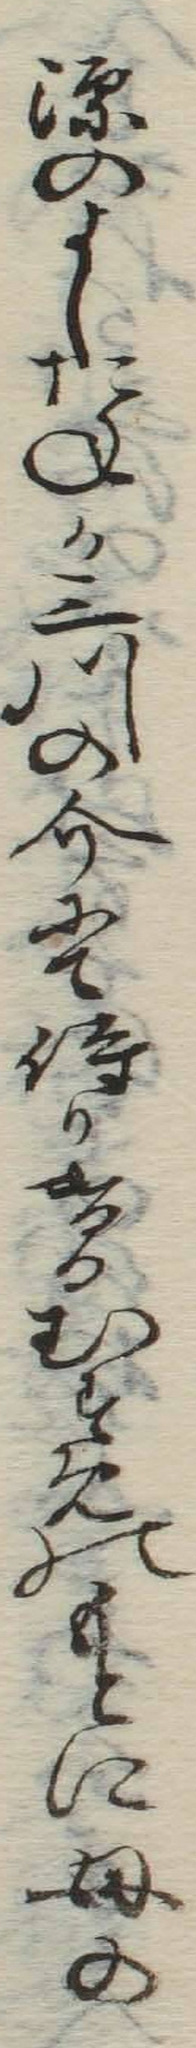源のよしたねか三川の介にて侍りけるむすめのもとに母の
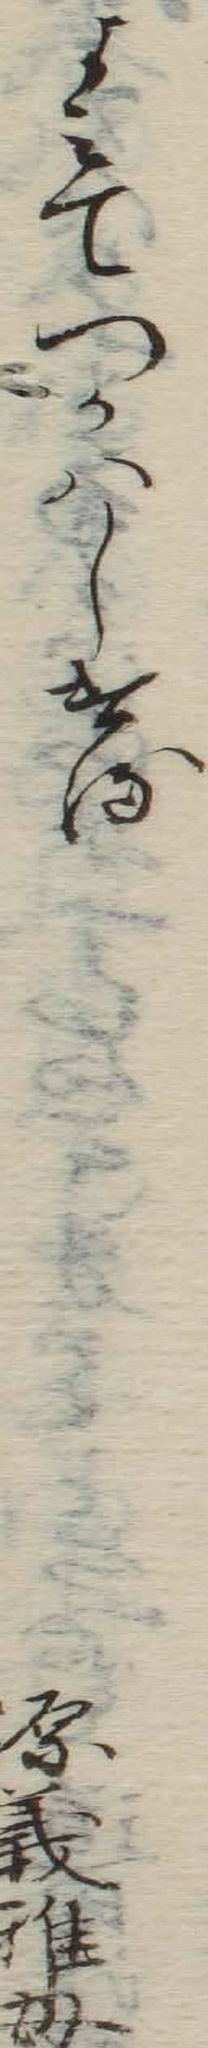よみてつかはしける源義雅母
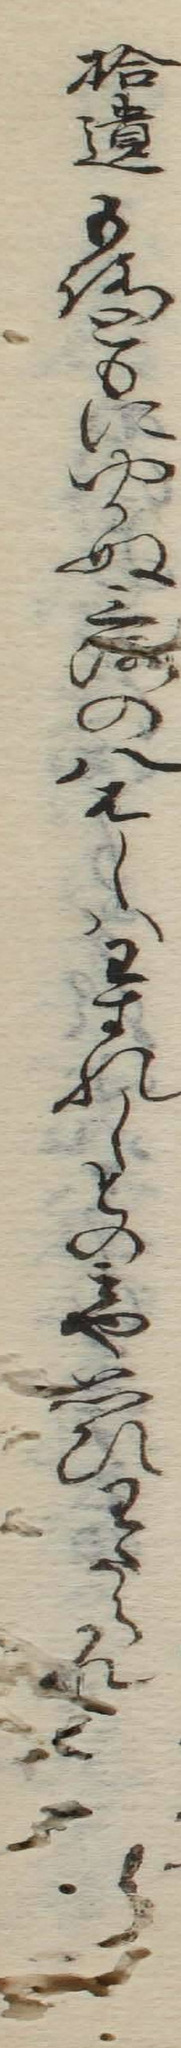拾遺もろともにゆかぬ三河の八はしはわすれしとのみや思ひわたらん
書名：三河国二葉松
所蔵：国文学研究資料館
